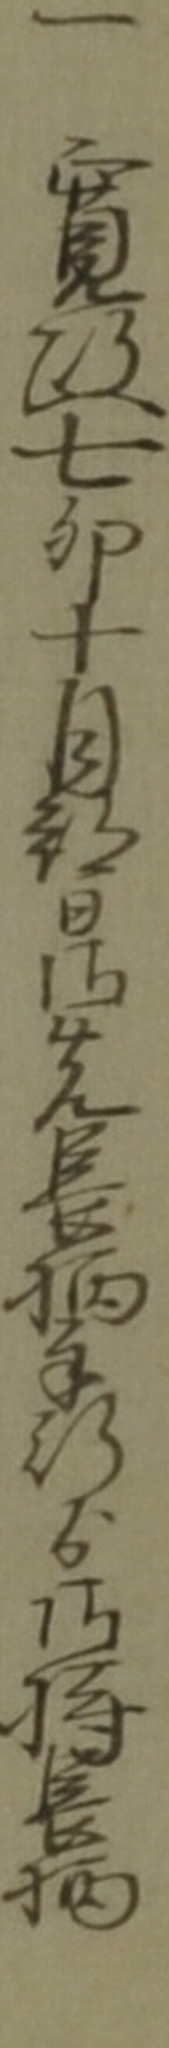一寛政七卯十月朔日御先長柄奉行ゟ御持長柄
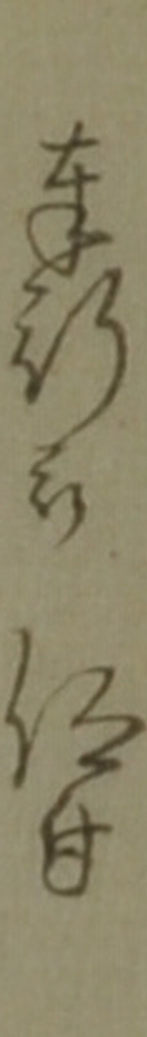奉行被仰付
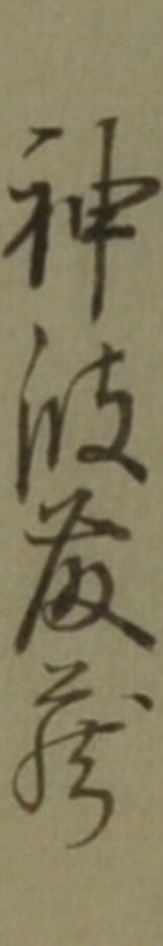神波藤藏
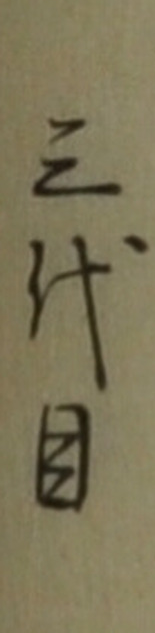三代目
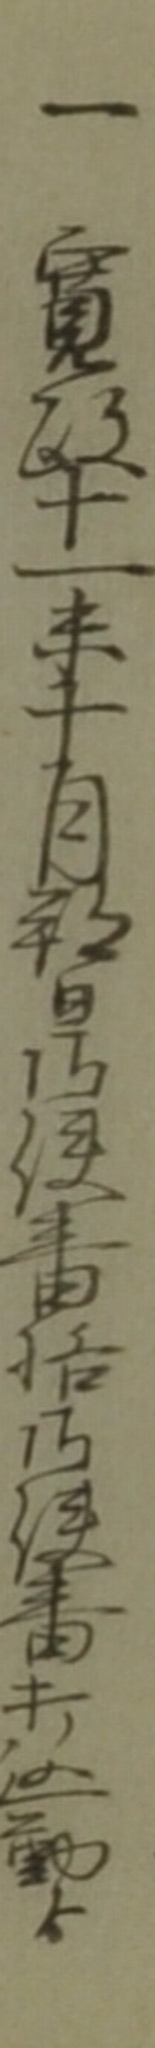一寛政十一未十月朔日御使番格御使番打込勤ゟ
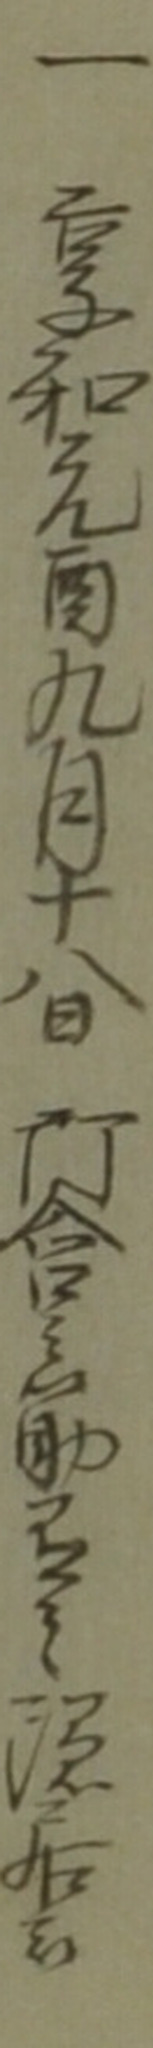一享和元酉九月十八日御含之筋有之隠居被
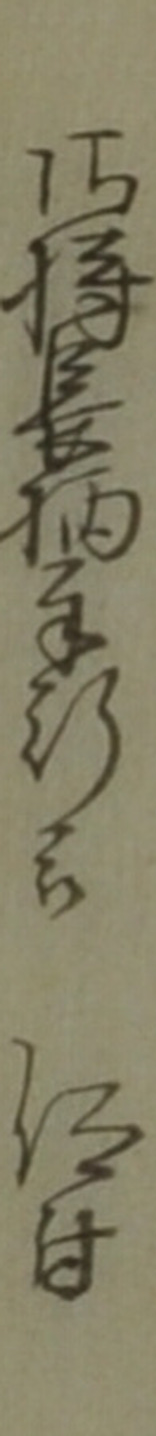御持長柄奉行被仰付
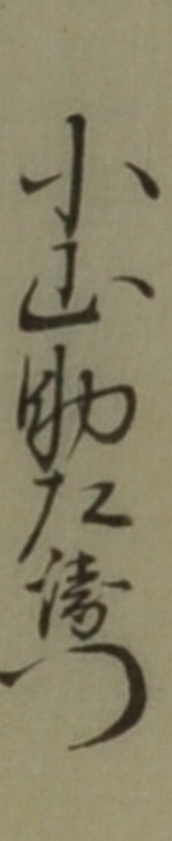小山助左衛門
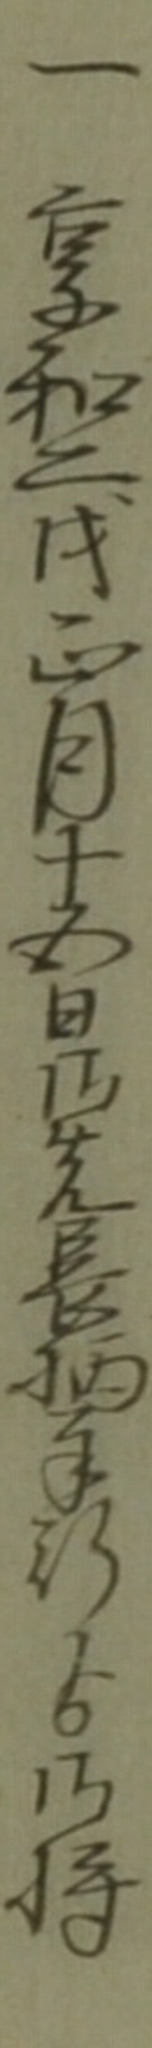一享和二戊正月十五日御先長柄奉行ゟ御持
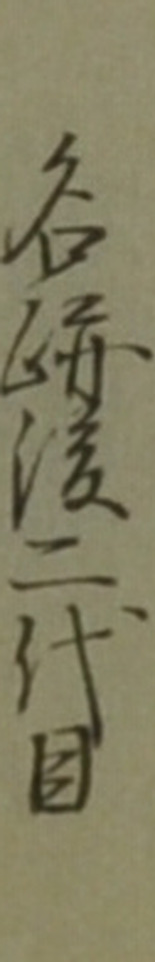名跡後二代目
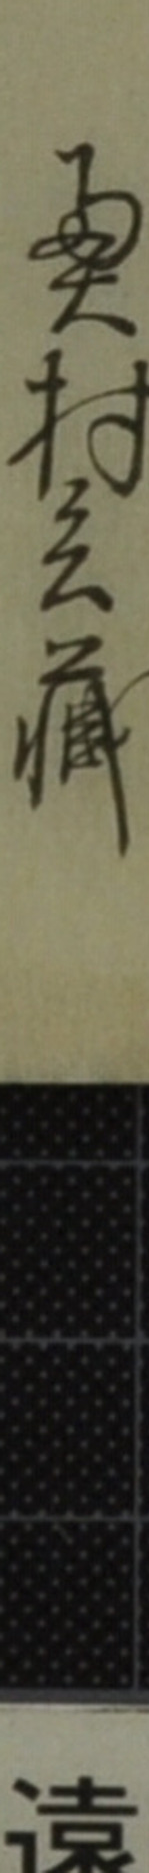奥村兵蔵
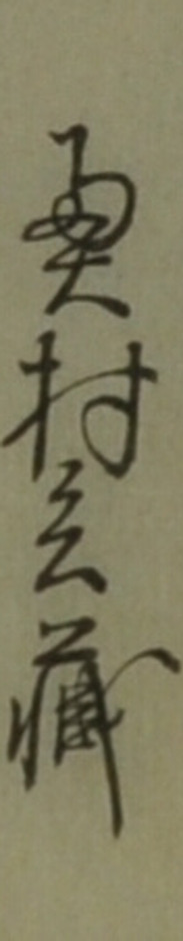奥村兵蔵
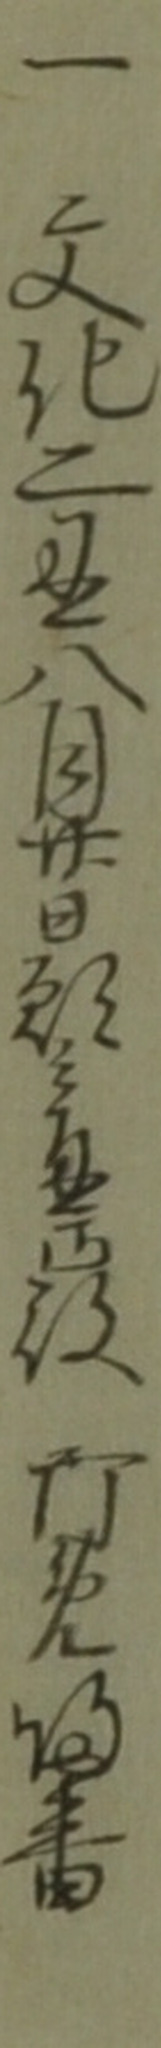一文化二丑八月廿日願之通御役御免帰番
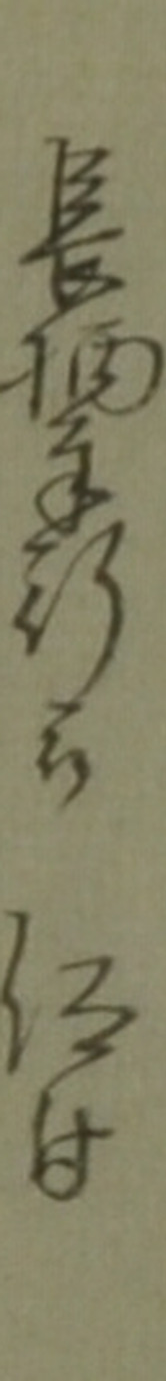長柄奉行被仰付
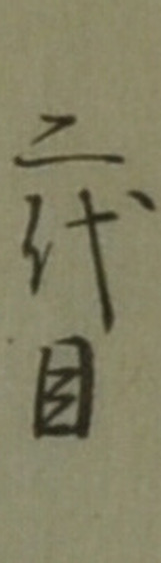二代目
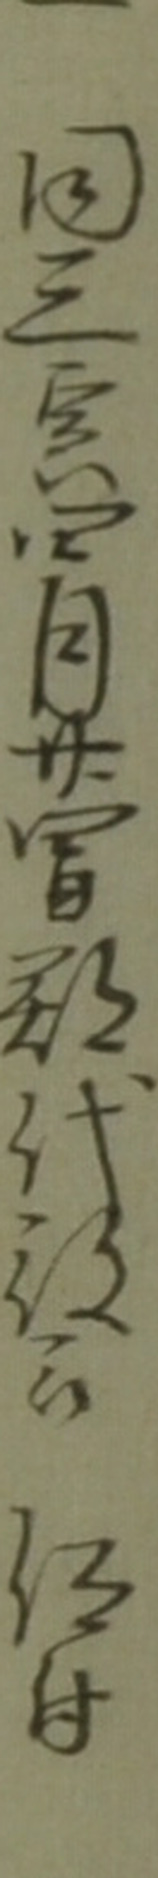一同三寅四月廿四日郡代役被仰付
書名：諸御役代々録（三）
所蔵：伊那市立高遠町図書館・合同会社AMANE
